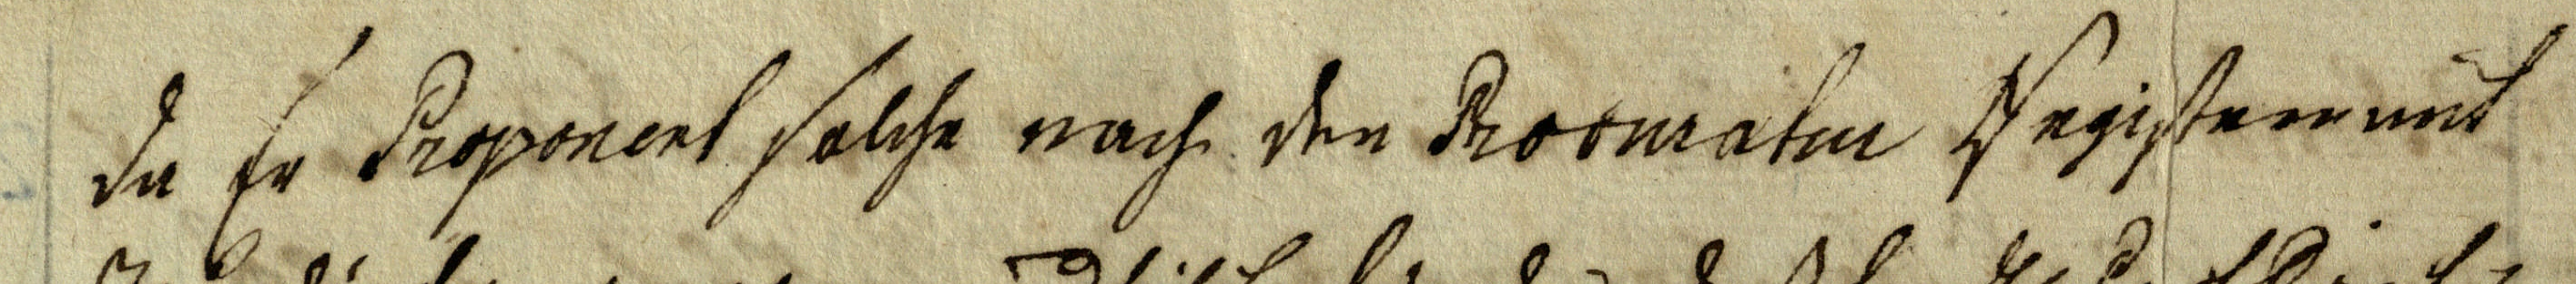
Da Er Proponent solche nach den Procuratur Registern mit
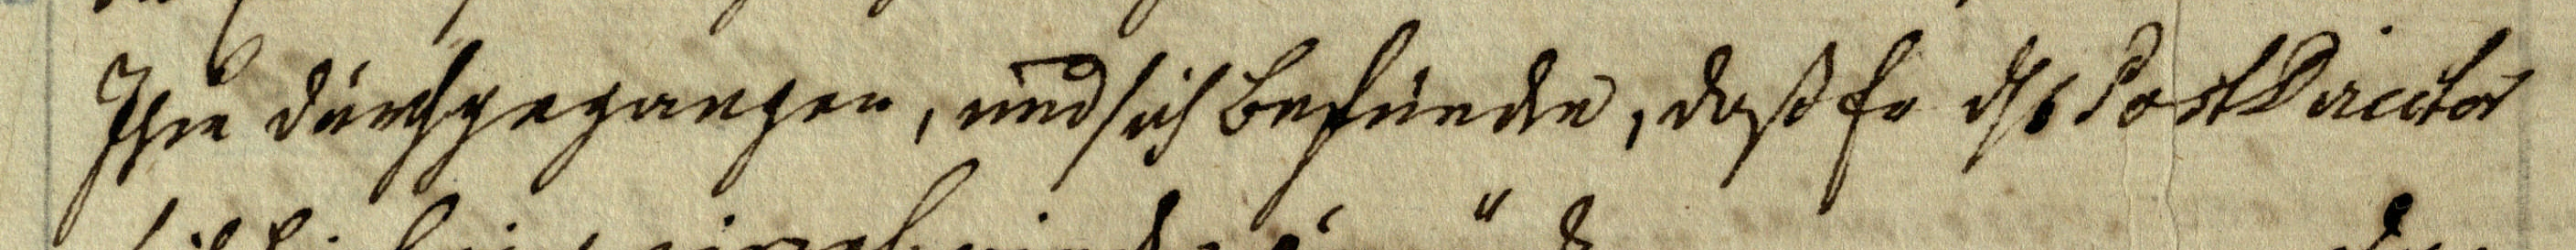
Ihm durchgegangen, und sich befunden, daß Er dh PostDirector
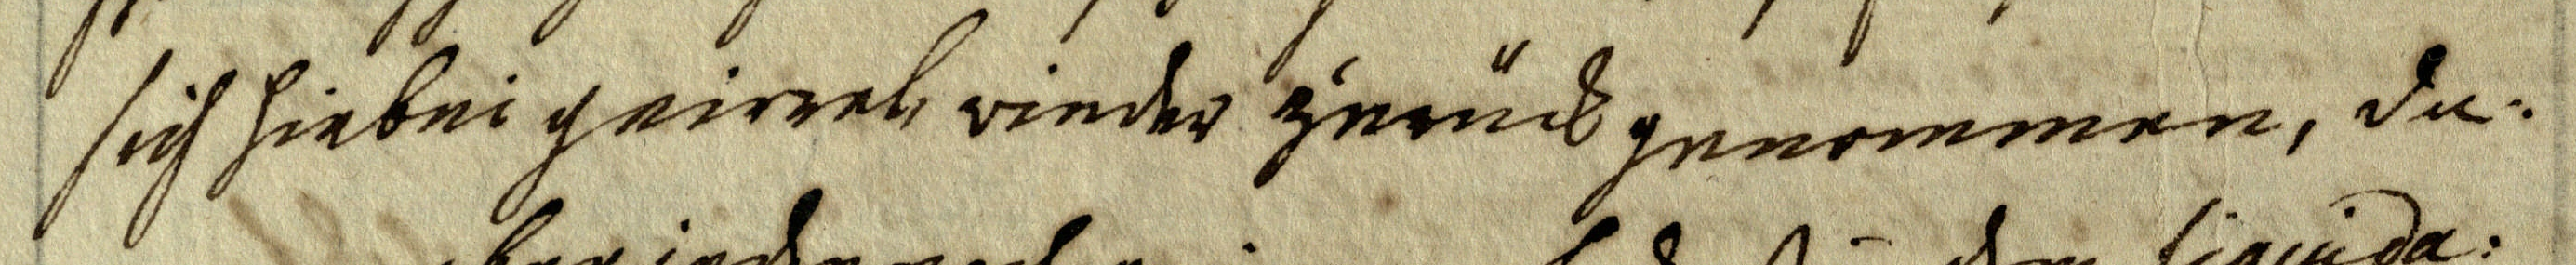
sich hiebei geirret, wieder zurück genommen, da¬
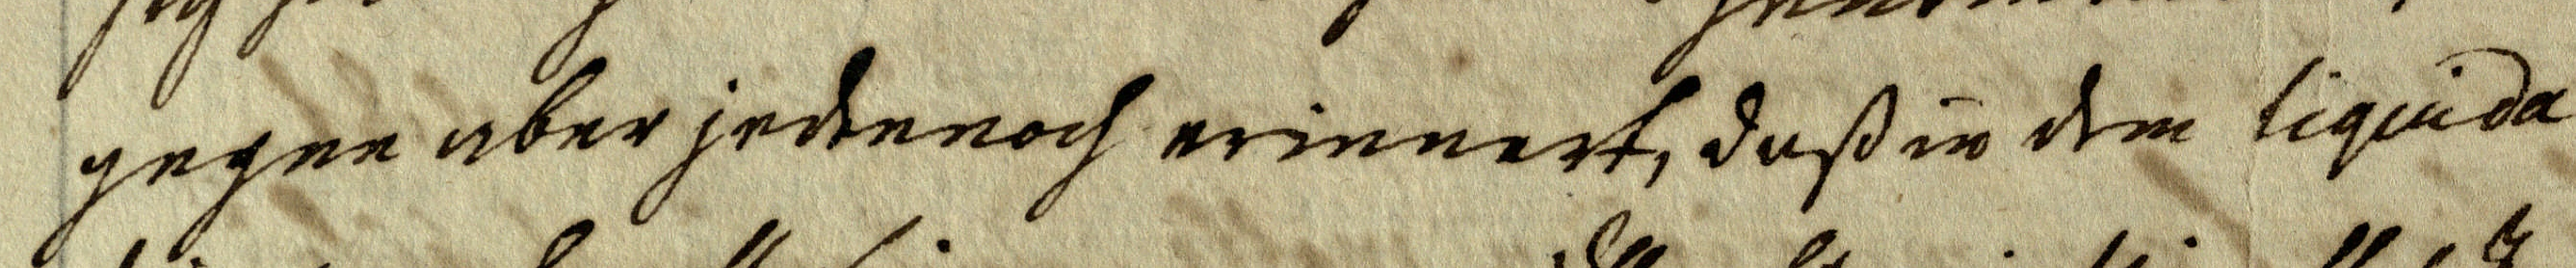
gegen aber jeder noch erinnert, daß in dem liquida¬
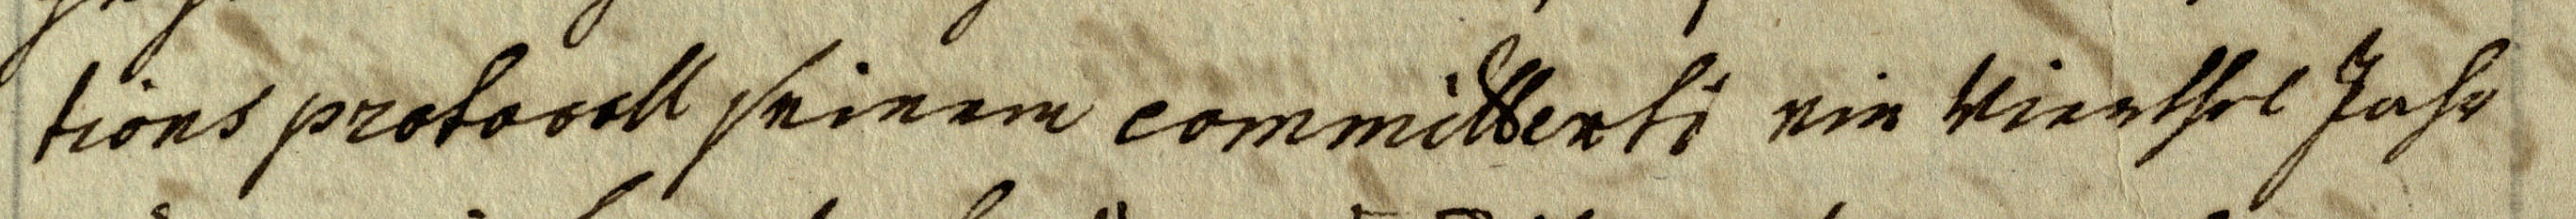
tions protocoll seinem committenti ein Vierthel Jahr
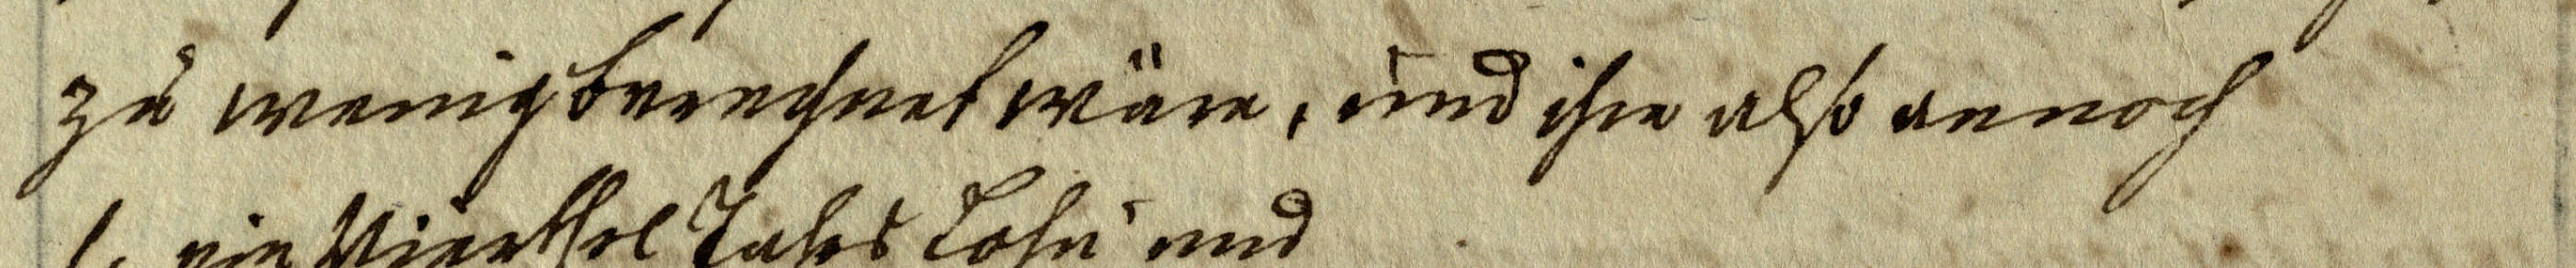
zu wenig berechnet wäre, und ihm also annoch
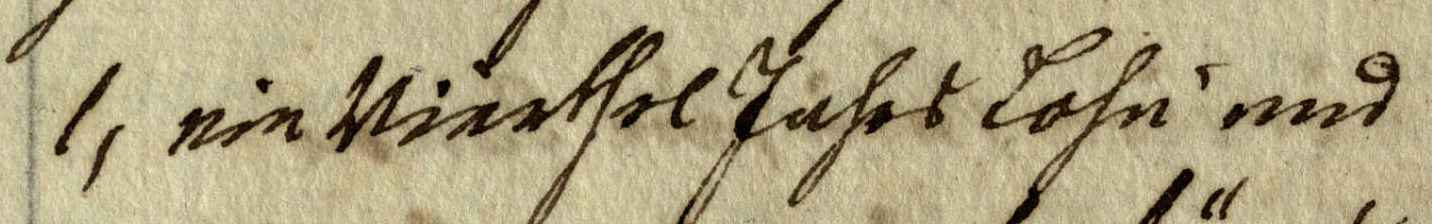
1, ein Vierthel Jahrs Lohn und
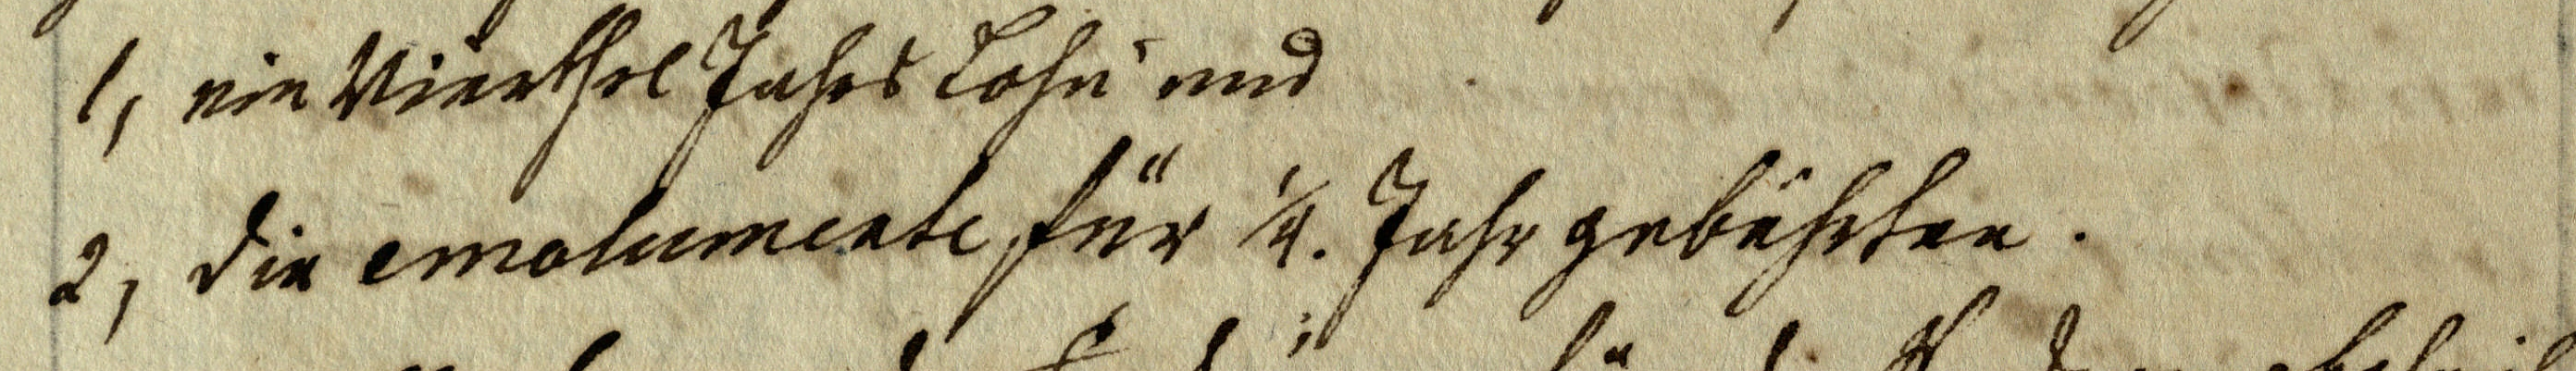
2, die emolumente für ¼ Jahr gebührten.
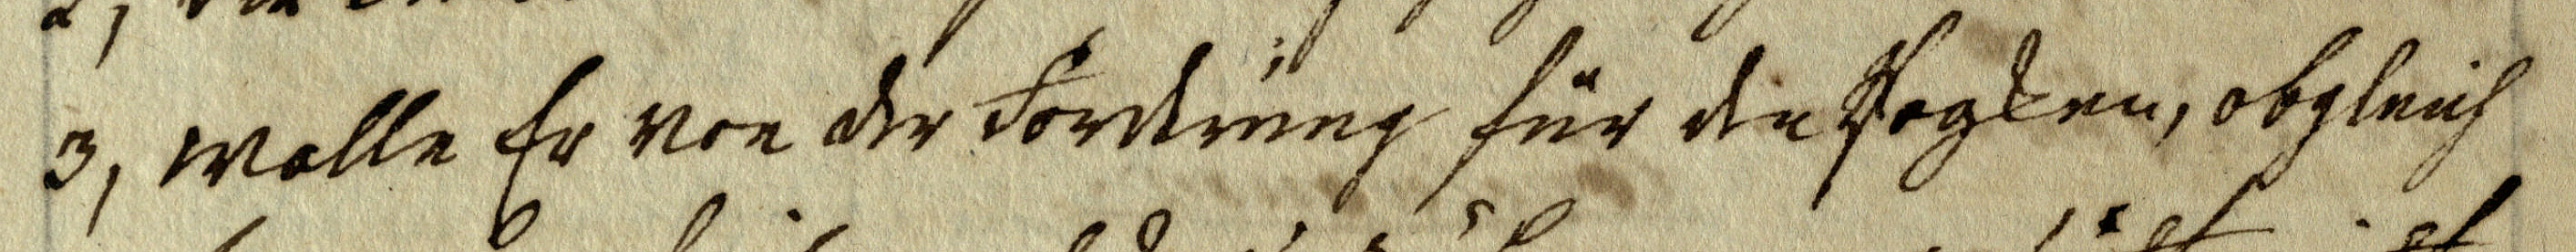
3, wolle Er von der Forderung für den Rogken, obgleich
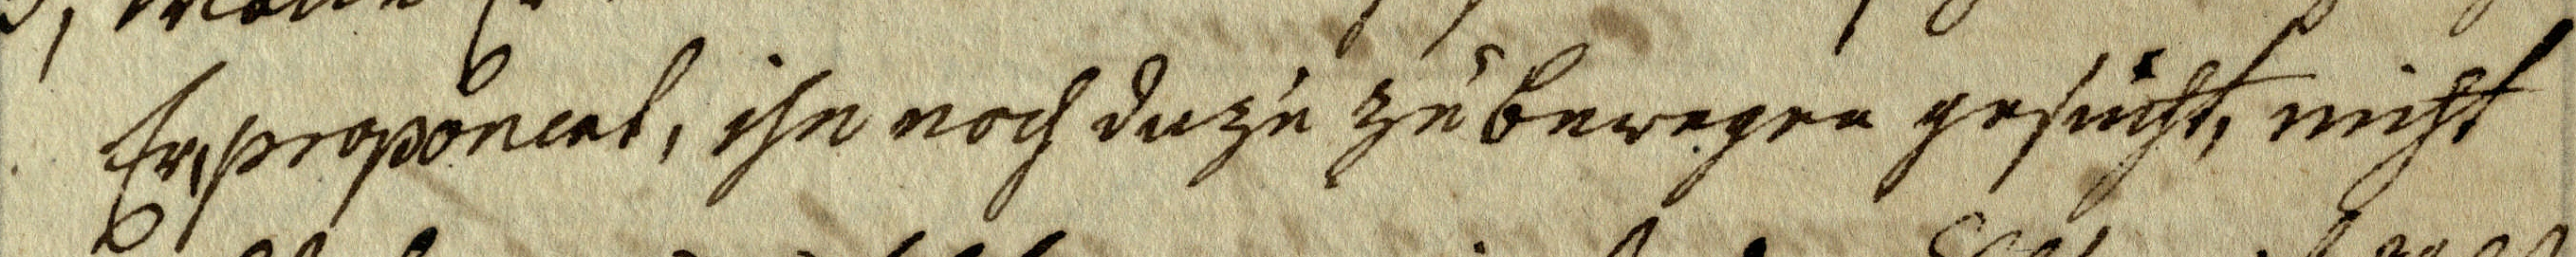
Er, proponent, ihn noch dazu zu bewegen gesucht, nicht
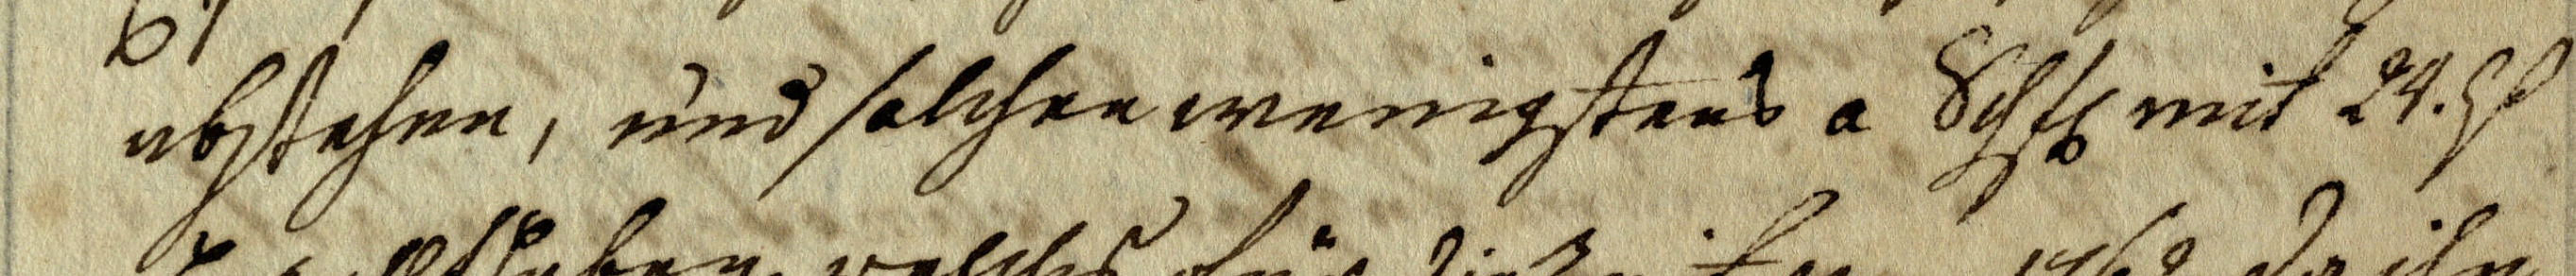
abstehen, und solchen wenigstens a 8rt mit 24 s.
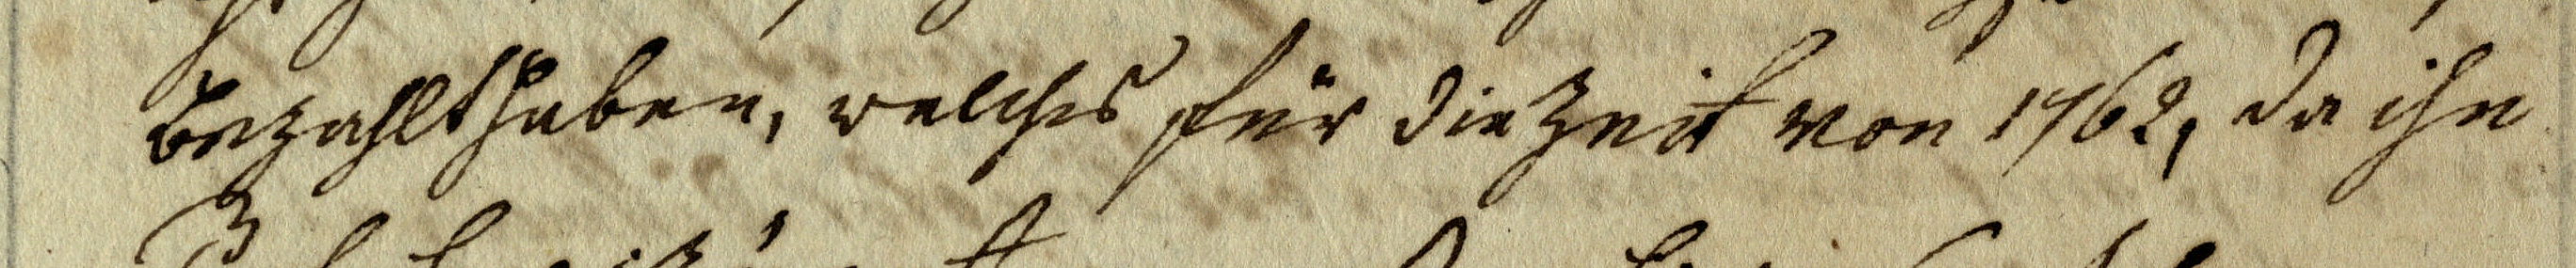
bezahlt haben, welches für die Zeit von 1762, da ihn
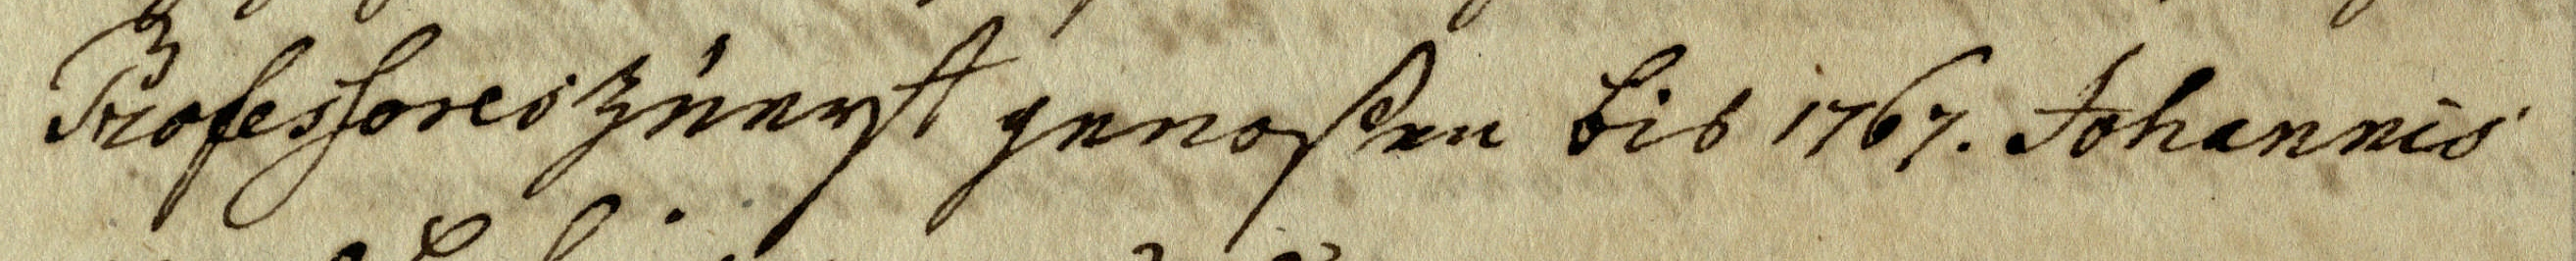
Professores zuerst genoßen bis 1767. Johannis
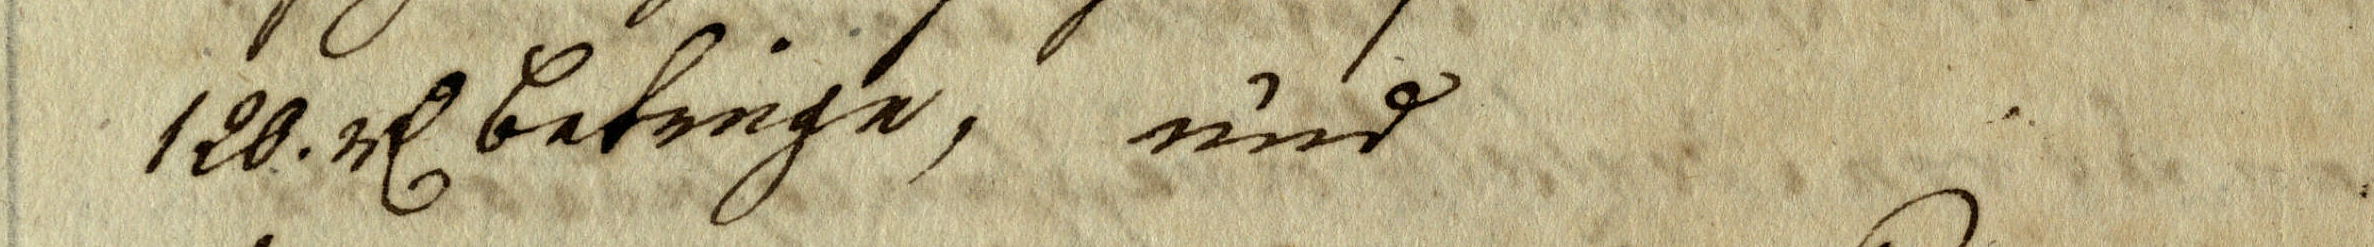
120. rt betrüge, und
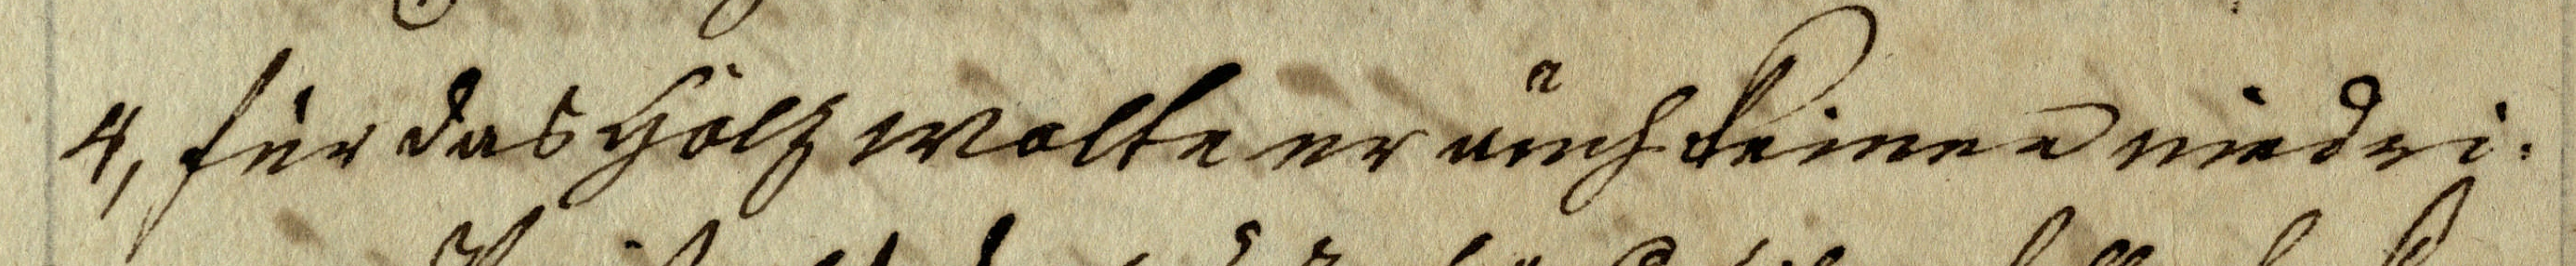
4, für das Holz wolte er auch keinen niedri¬
